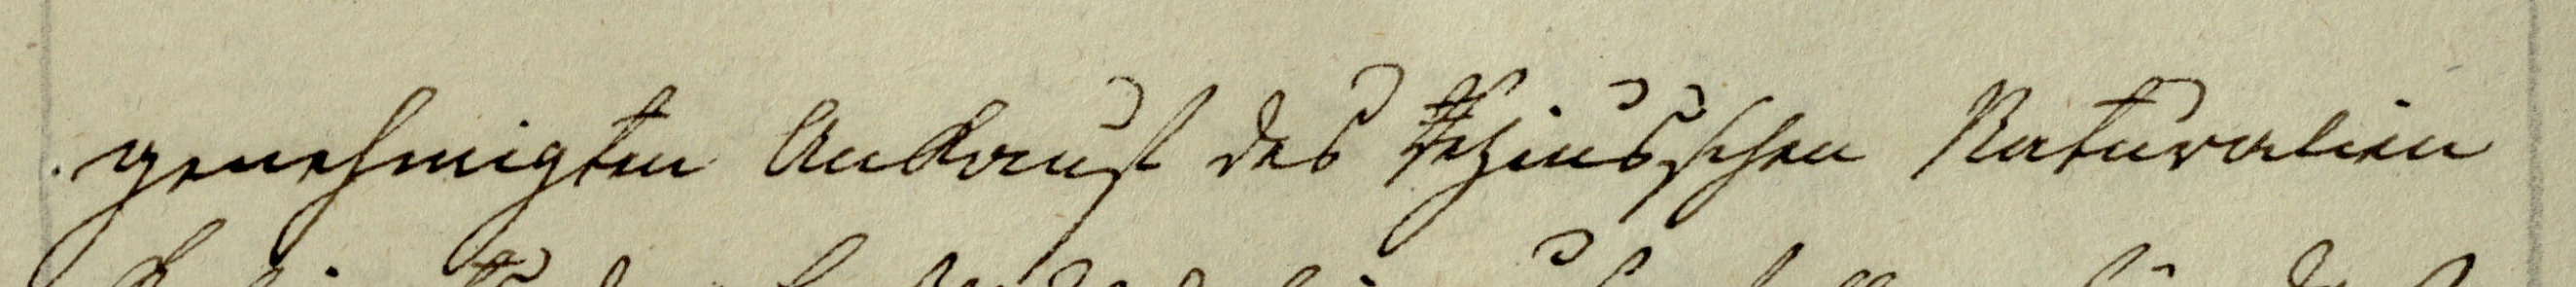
genehmigten Ankauf des Reziusschen Naturalien
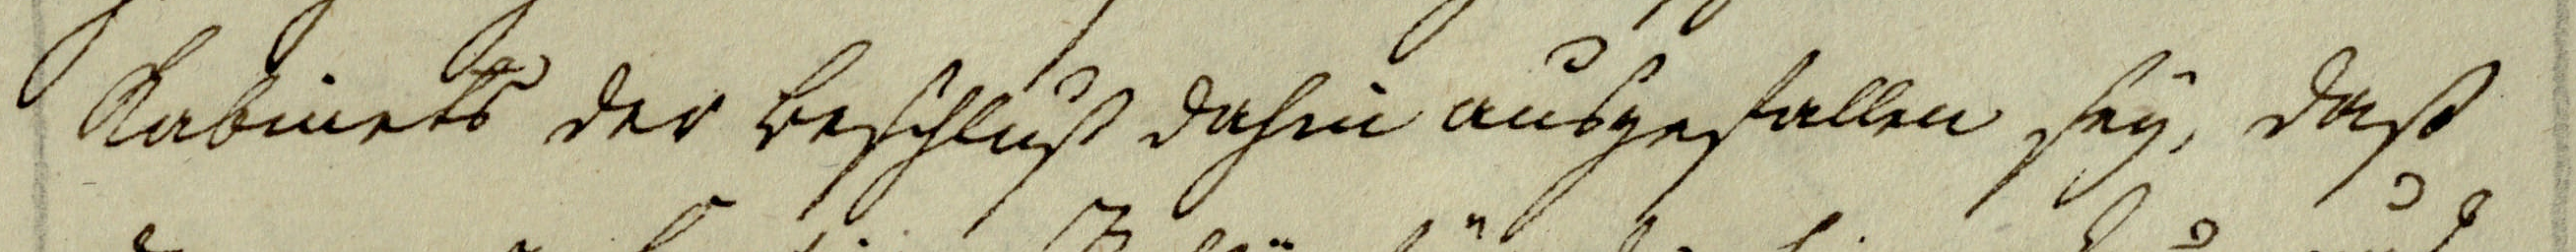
Kabinets der Beschluß dahin ausgefallen seÿ, daß
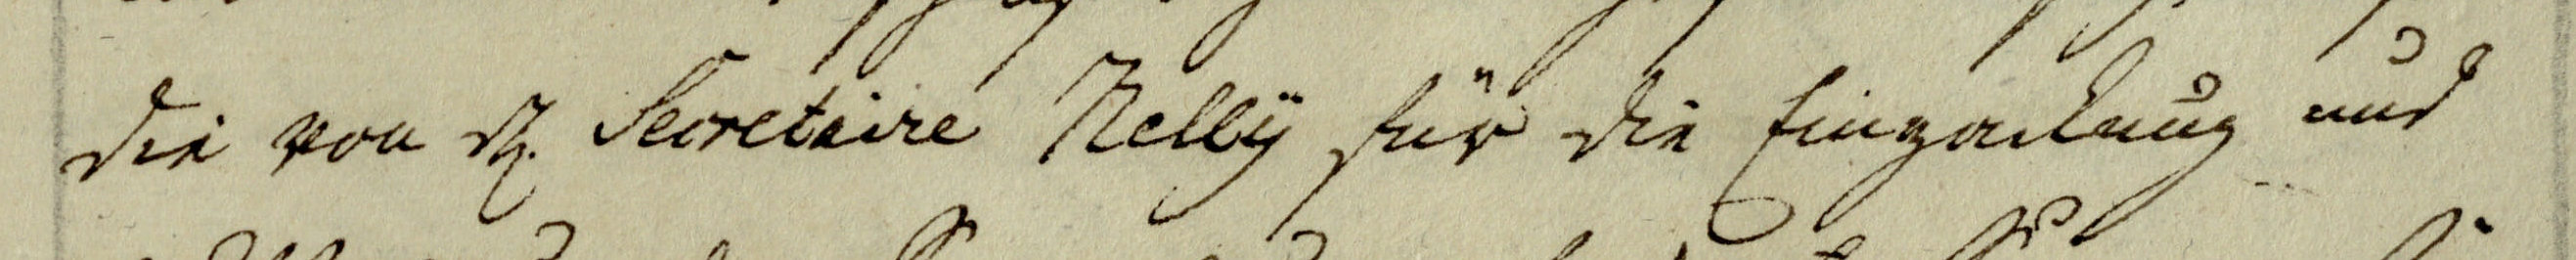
die von dh. Secretaire Nellÿ für die Einpackung und
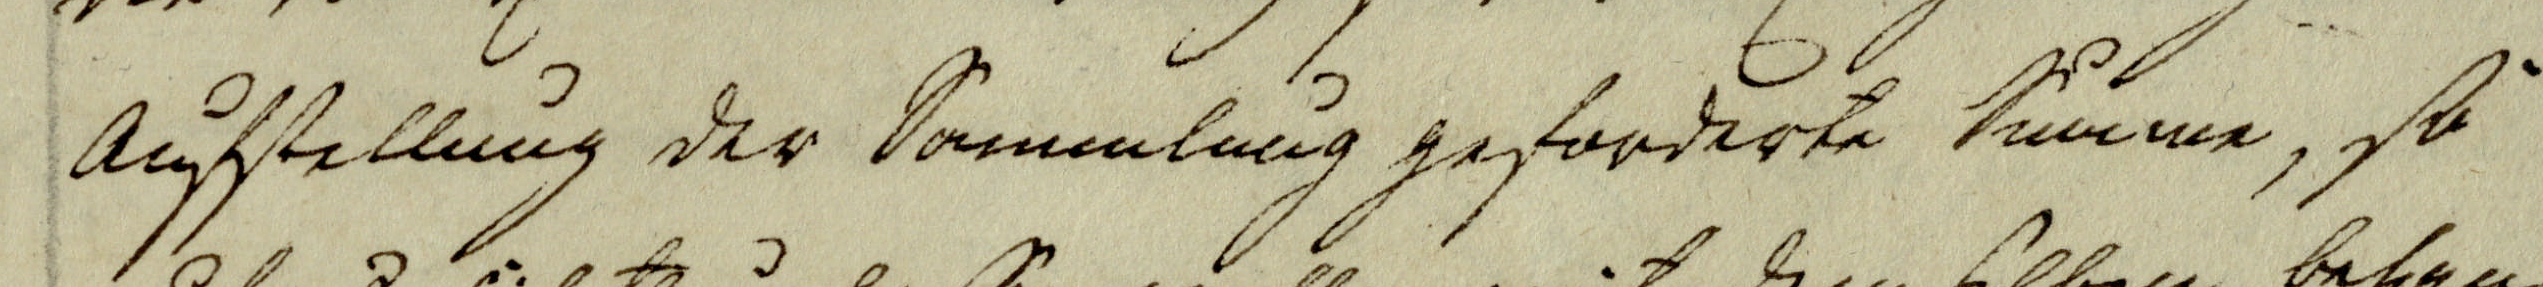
Aufstellung der Sammlung geforderte Summe, so
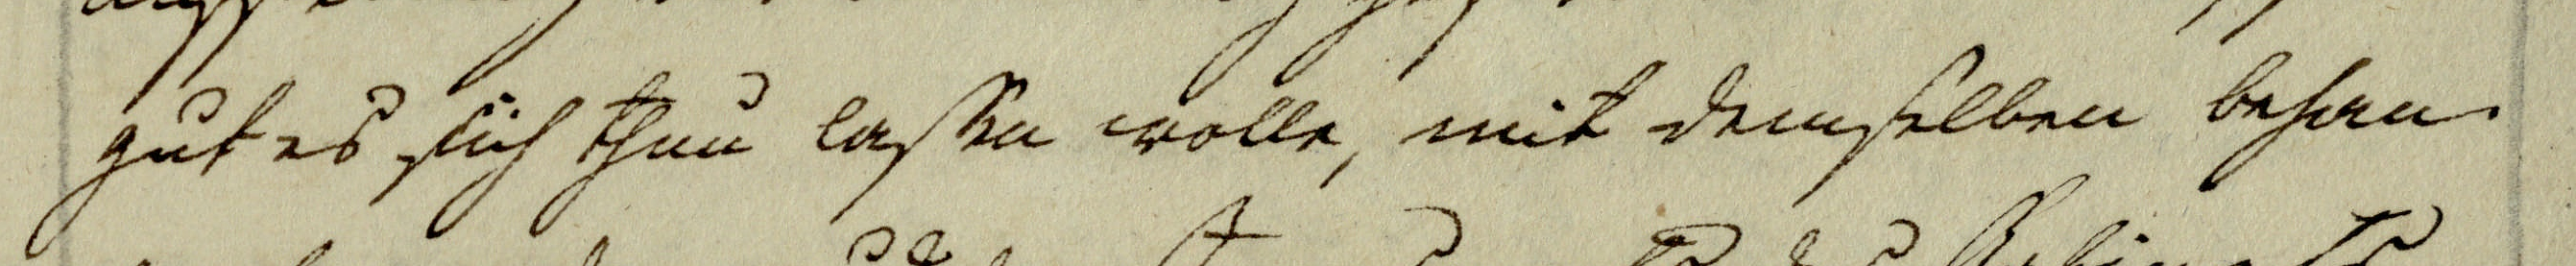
gut es sich thun lassen wolle, mit demselben behan¬
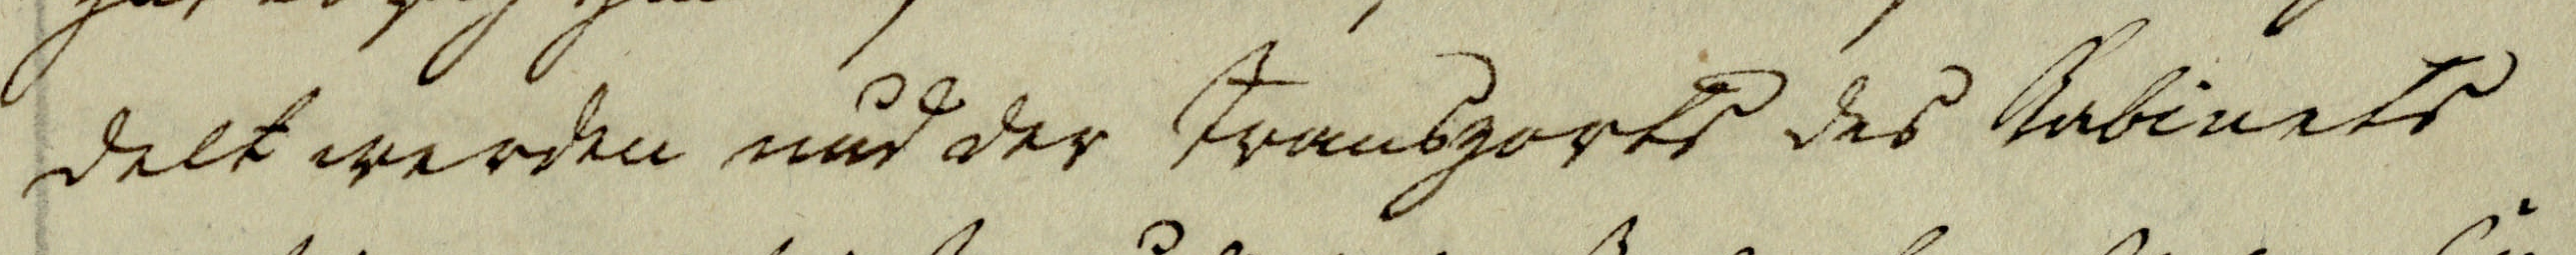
delt werden und der Transports des Kabinets
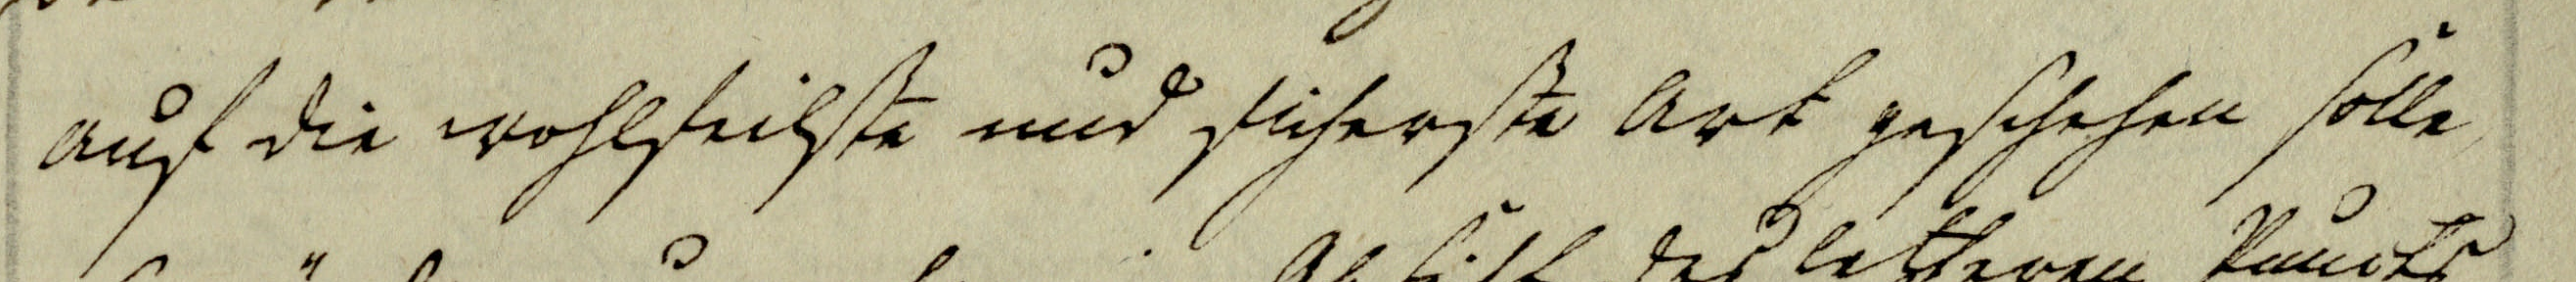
auf die wohlfeilste und sicherste Art geschehen solle
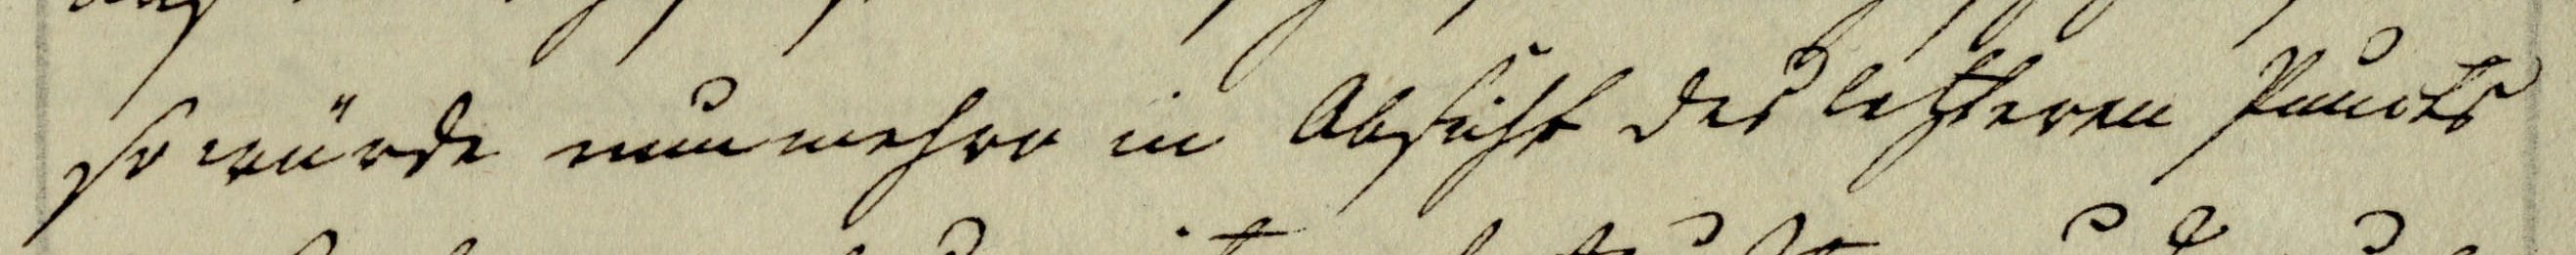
so würde nunmehro in Absicht des letzteren Puncts
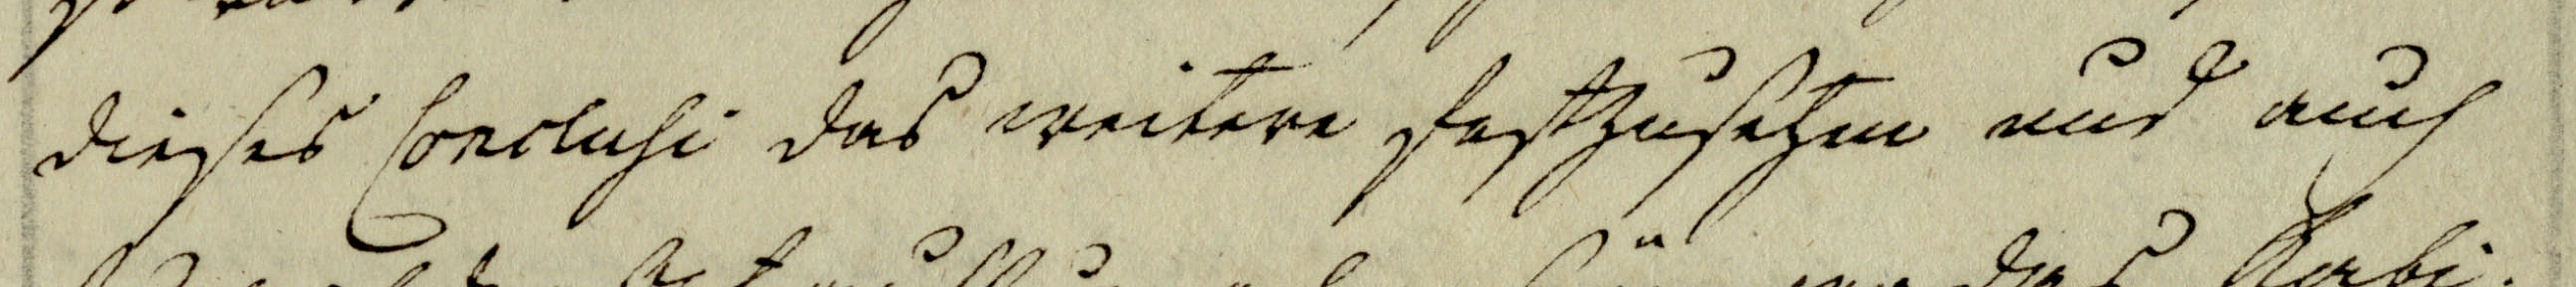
dieses Conclusi das weitere festzusetzen und auch
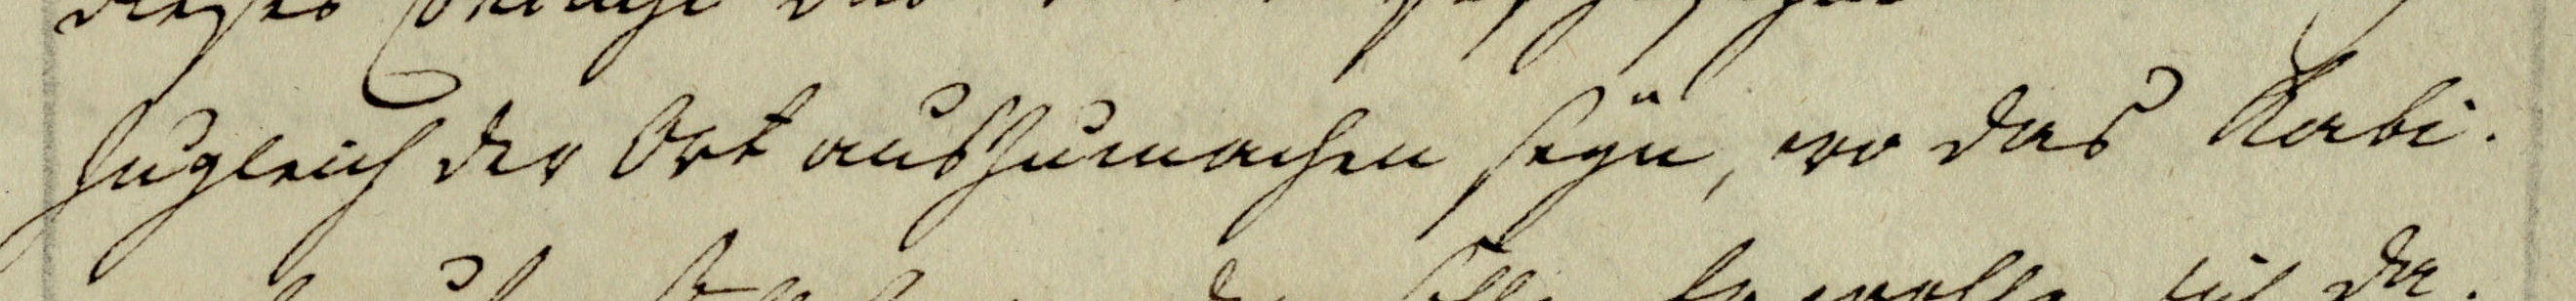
zugleich der Ort auszumachen seÿn, wo das Kabi
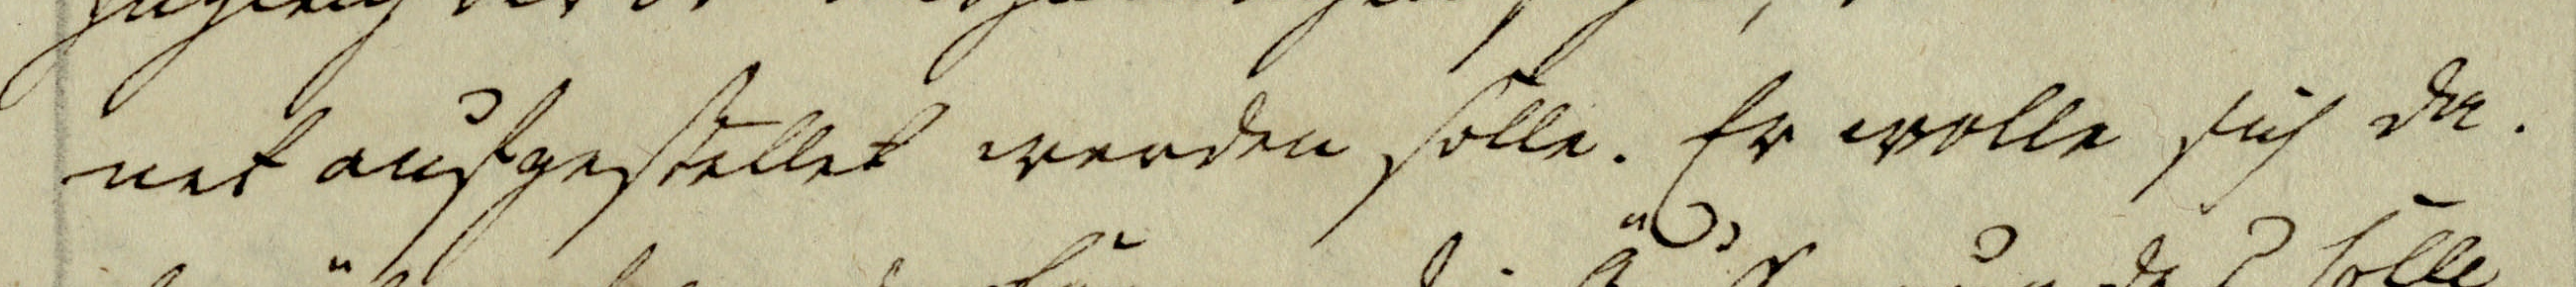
net aufgestellet werden solle. Er wolle sich da¬
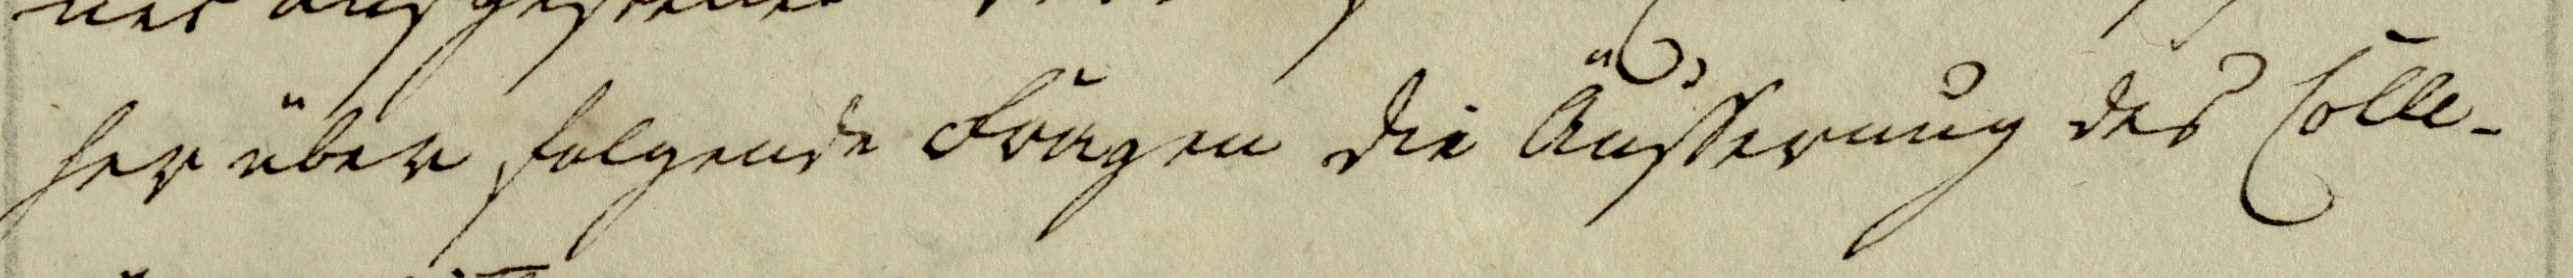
her über folgende Fragen die Äusserung des Colle¬
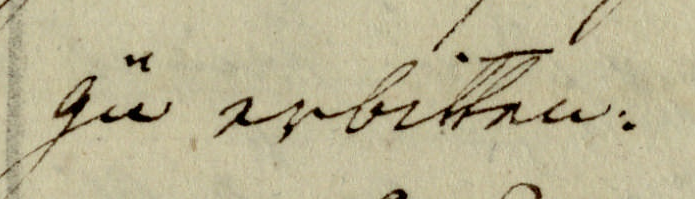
gii erbitten.
